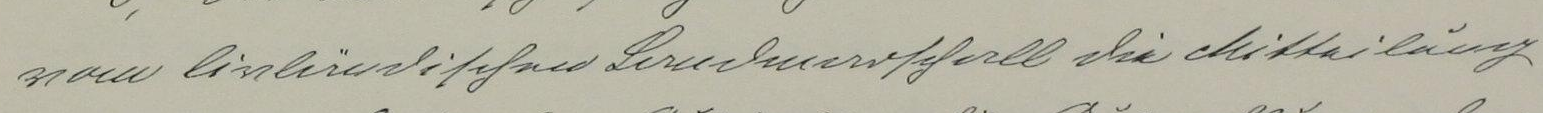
vom livländischen Landmarschall die Mitteilung
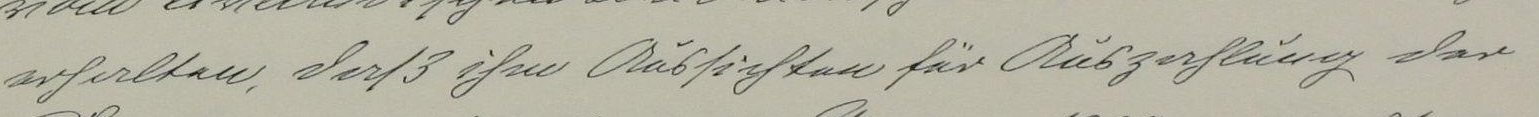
erhalten, daß ihm Aussichten für Auszahlung der
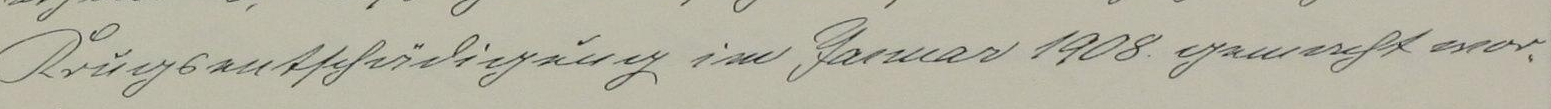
Krugsentschädigung im Januar 1908. gemacht wor-
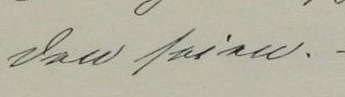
den seien.
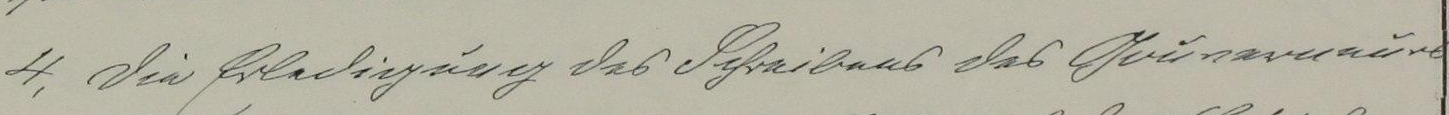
4. Die Erledigung des Schreibens des Gouverneurs
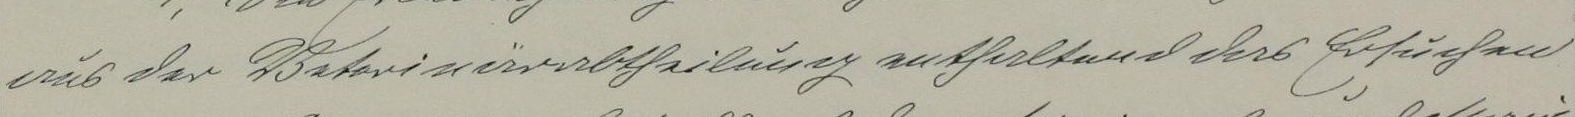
aus der Veterinärabtheilung enthaltend das Ersuchen
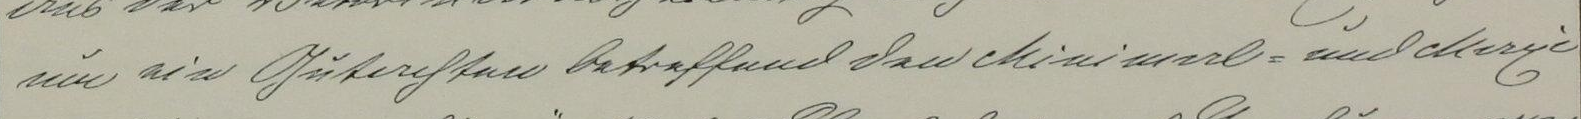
um ein Gutachten betreffend den Minimal- und Maxi-
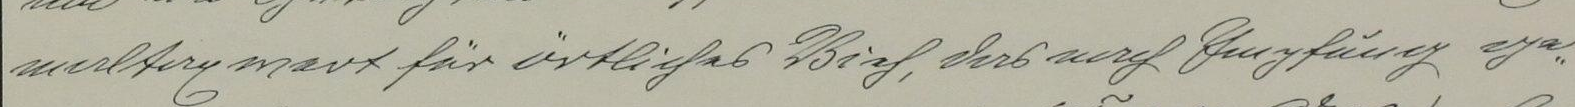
maltaxwert für örtliches Vieh, das nach Impfung ge-
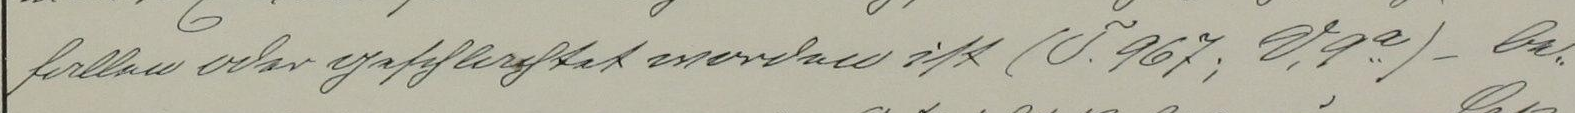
fallen oder geschlachtet worden ist (T. 967; V.9a) - be-
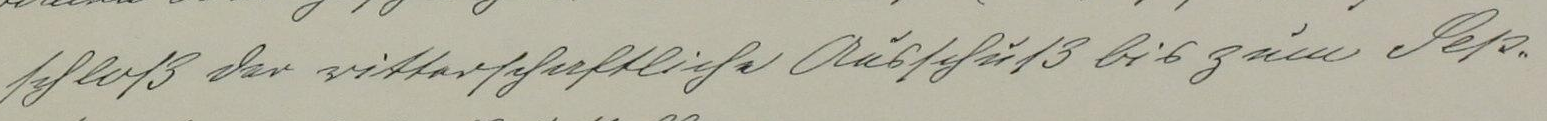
schloß der ritterschaftliche Ausschuß bis zum Sep-
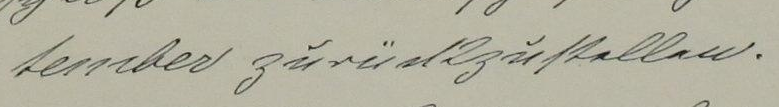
tember zurückzustellen.
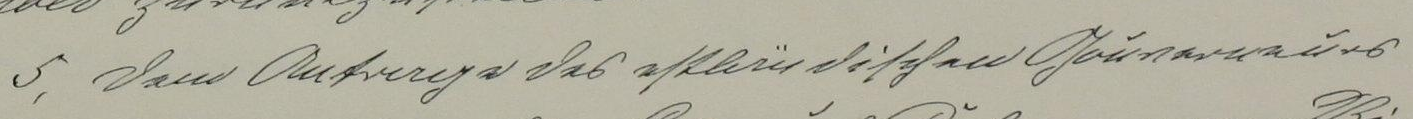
5. Dem Antrage des estländischen Gouverneurs
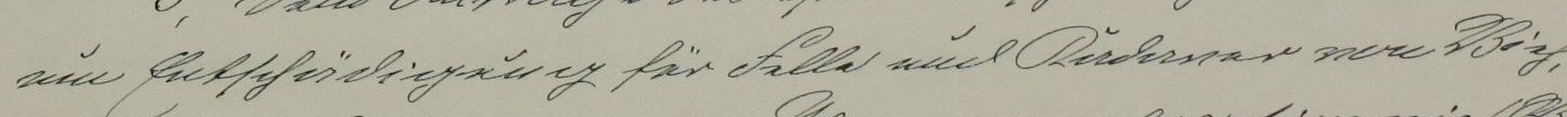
um Entschädigung für Felle und Kadaver von Vieh,
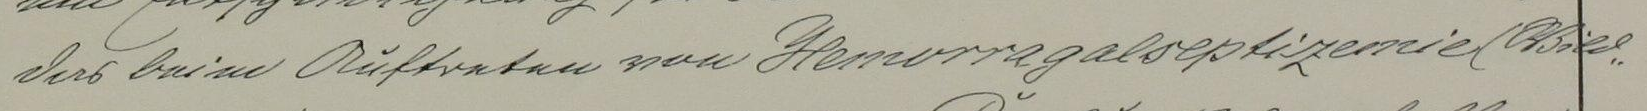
das beim Auftreten von Hemorragalseptizemie (Wild-
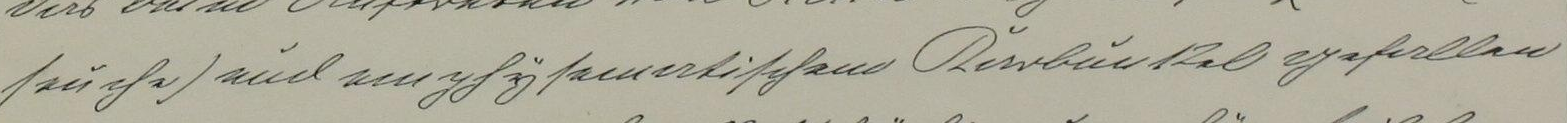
seuche) und emphysematischem Karbunkel gefallen
